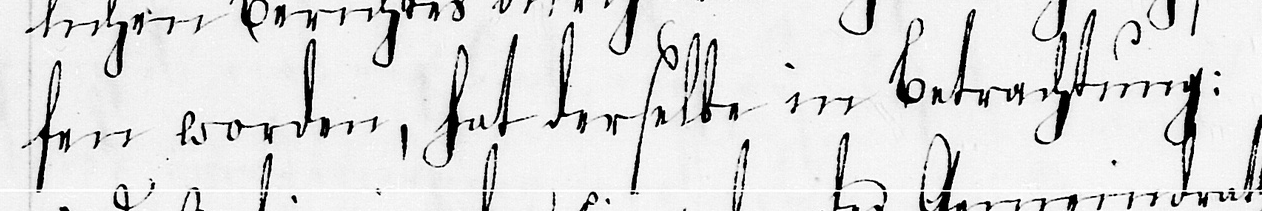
fen worden, hat derselbe in Betrachtung:
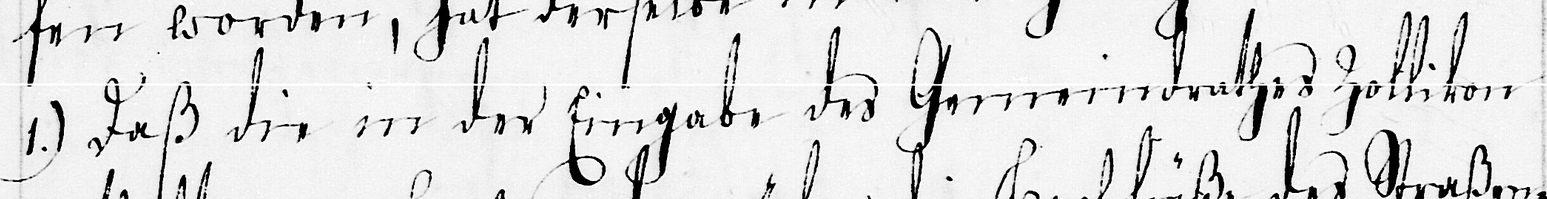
1.) Daß die in der Eingabe des Gemeindrathes Zollikon
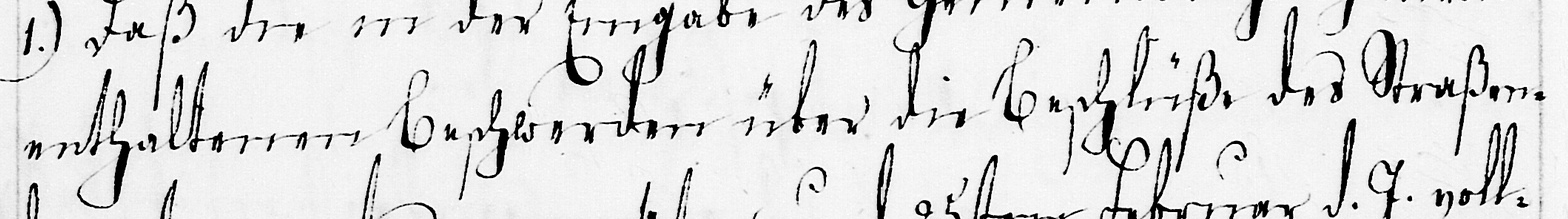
enthaltenen Beschwerden über die Beschlüße des Straßen¬
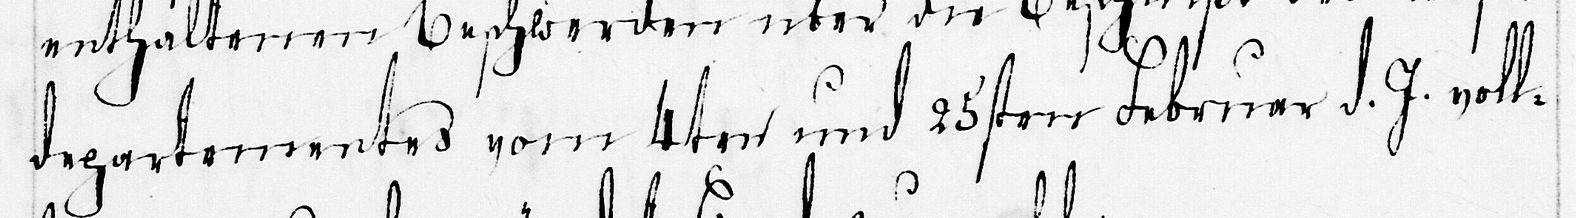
departementes von 4ten und 25sten Februar d. J. vol¬
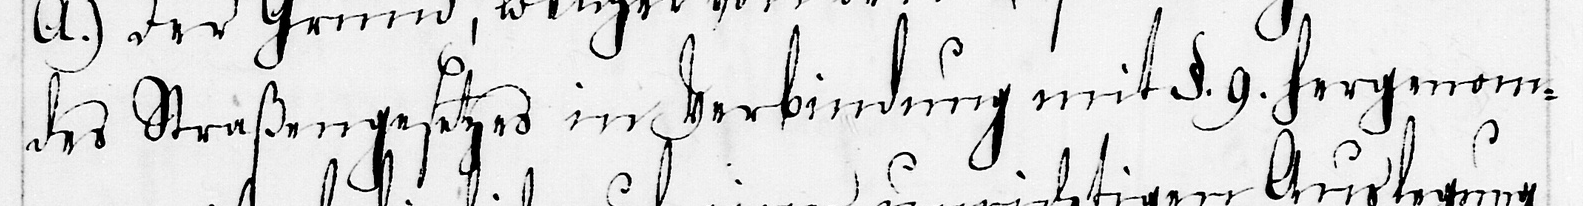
des Straßengesetzes in Verbindung mit §. 9. hergenom¬
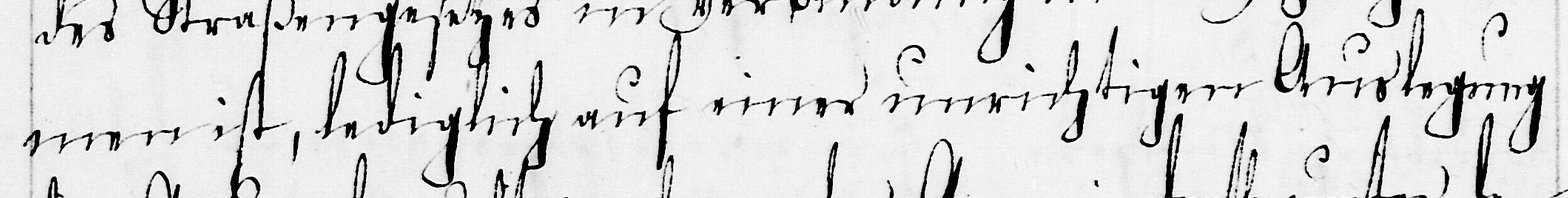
men ist, lediglich auf einer unrichtigen Auslegung
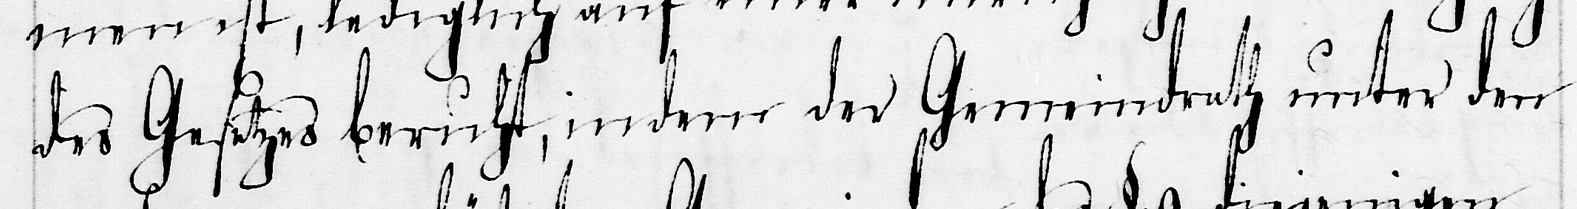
des Gesetzes beruht, indem der Gemeindrath unter den
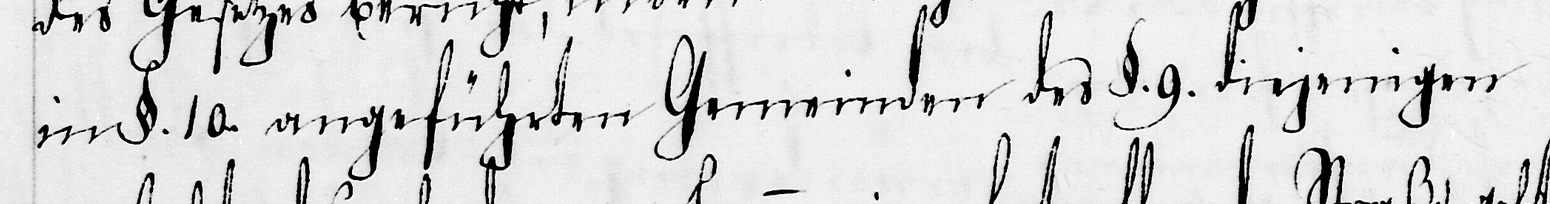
in §. 10. angeführten Gemeinden des §. 9. diejenigen
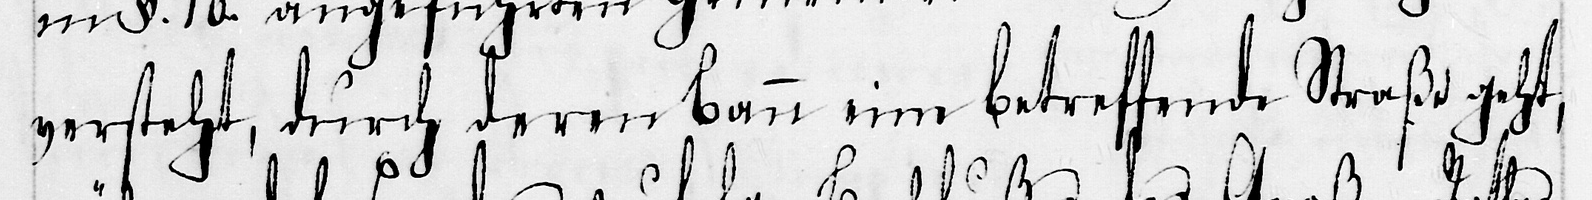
versteht, durch deren Bau eine betreffende Straße geht,
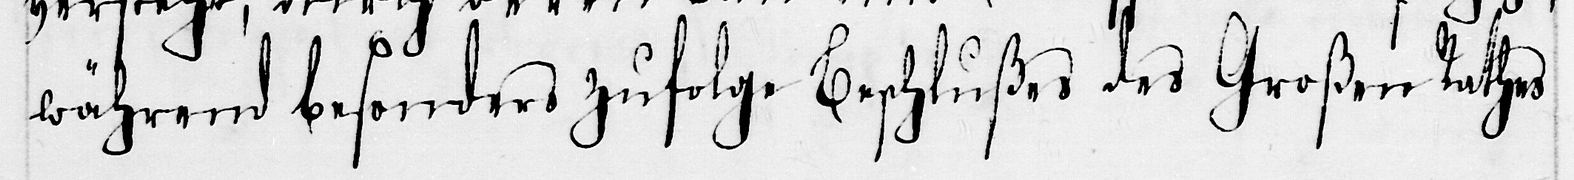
während besonders zufolge Beschlußes des Großen Rathes
